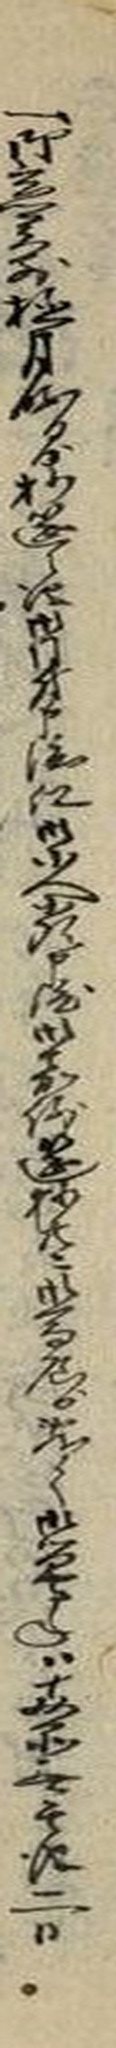一御玄関前極月晦日ゟ杪筵之儀御目付申渡但御小人小頭申渡御嘉例筵杪共に御馬屋ゟ敷之御留守年は両所無其儀二日
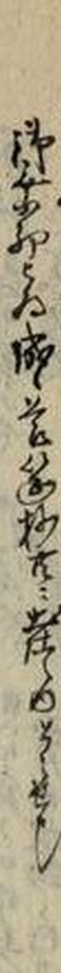御乗初被為成候節筵杪共に出仕候内とらせ申候
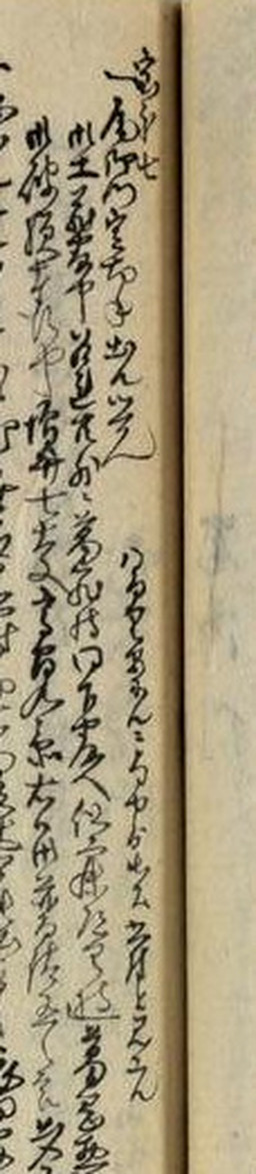一瓦御門定切手出候覚八百里案ルに与力ゟ出ス書付と見エル
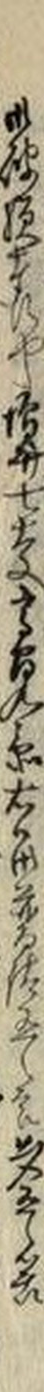御破損奉行中増井七太夫高間九兵衛右は御普請有之候節出入有候之筈
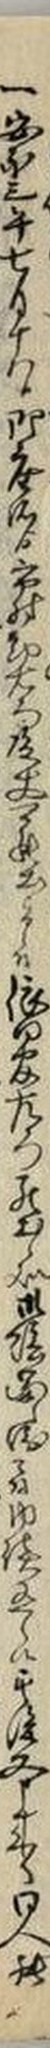一安永三午七月十八日御座所ゟ市村勘右衛門殿使可罷出旨ニ付依田官左衛門罷出候処御絵図之儀に付内談有之候其後又申来候同人罷
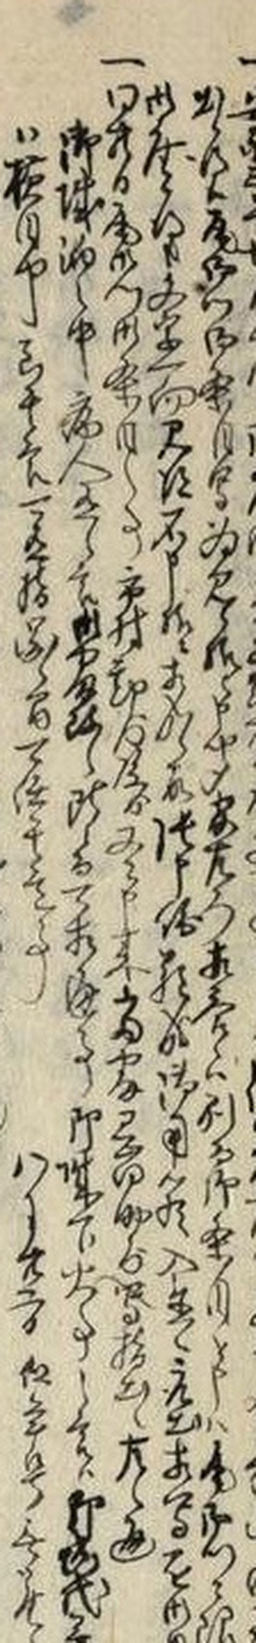一同廿日瓦御門御条目之事市村勘左衛門殿ゟ又々申来当番岡田助右衛門写差出候左之通
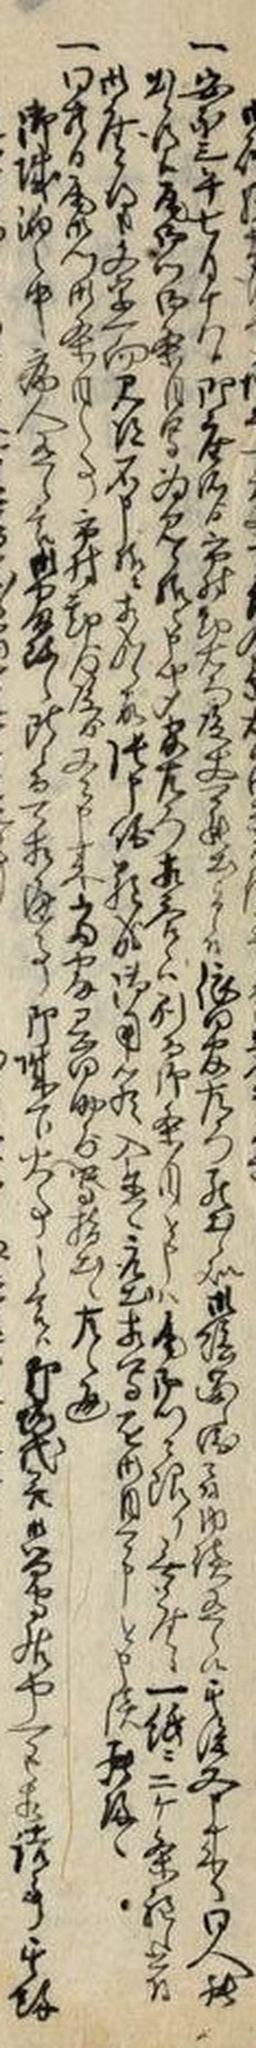御座候得共文字一向見得不見得様に相成候故張申儀難成御用箱入置候取出相写懸御目可申と申談罷帰候
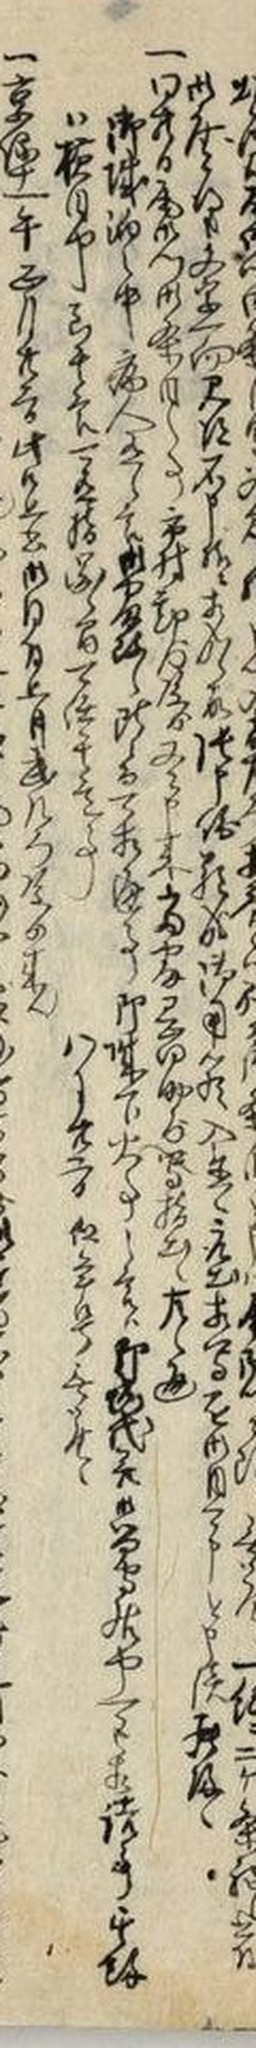御城泊之中病人有之候節御番改之断に而可相通候事御城下火事之節は御城代并御留守居中可被相詰事其餘
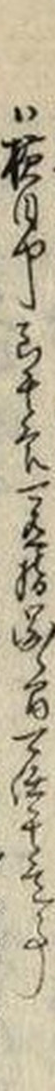は横目中至其節可有指図候間可任其意候事
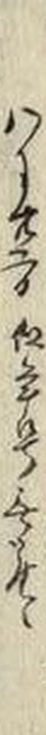八月廿二日但年号無御座候
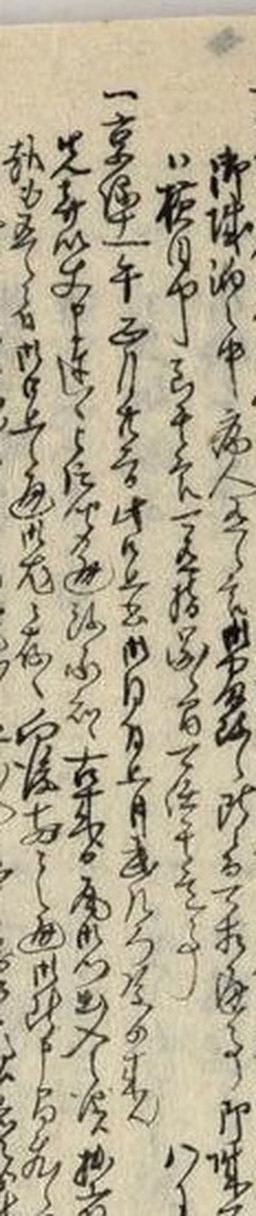一享保十一午正月廿二日此口上書御目付上月武左衛門殿ゟ来候
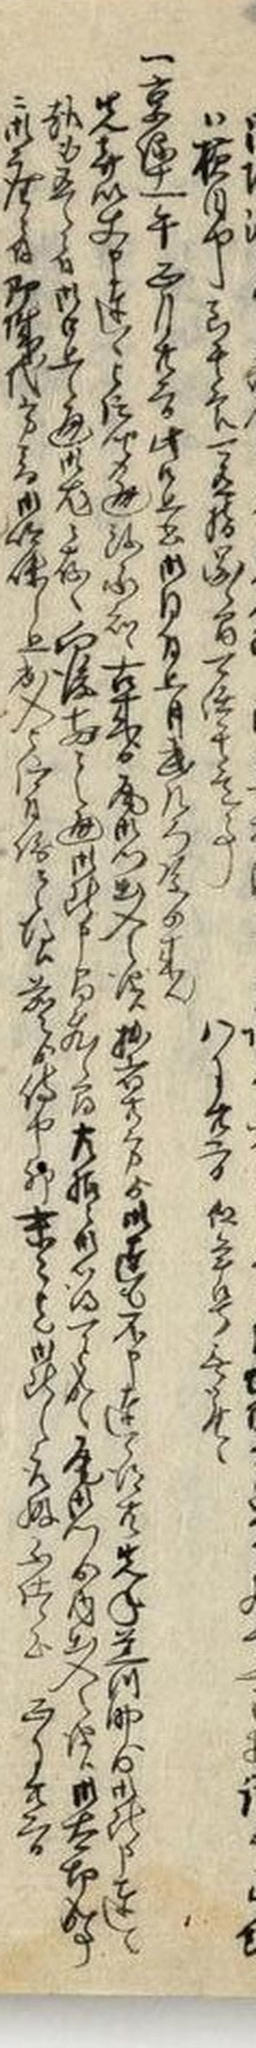先刻以使申達候被仰聞通致承知候古来ゟ瓦御門出入之儀は拙者共方ゟ御達も不申達候得共先年荒川助右衛門御断申達候
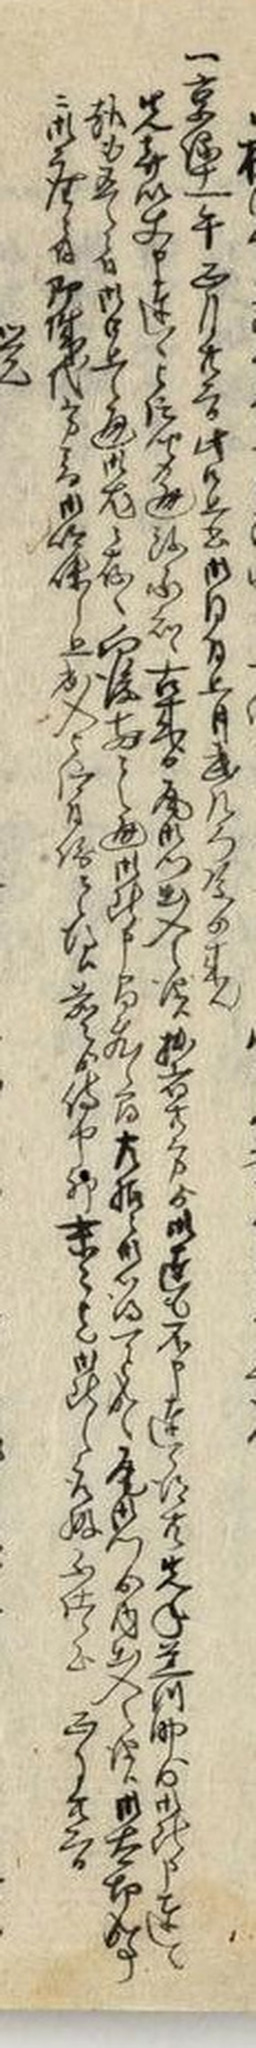趣も有之候付御口上之通御尤に存候向後前々之通御断申間敷候間左様之御心得可被成候瓦御門ゟ内出入候儀は御太切成事
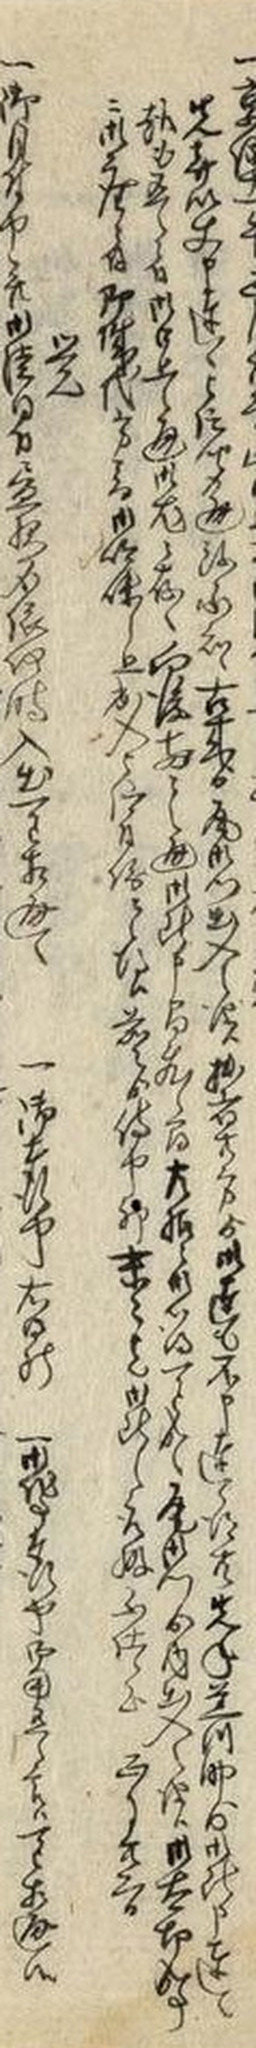に御座候に付御城代方に而御吟味之上出入被仰付儀に候得は前々ゟ侍中初末々迄御断之取扱不仕候以上正月廿二日
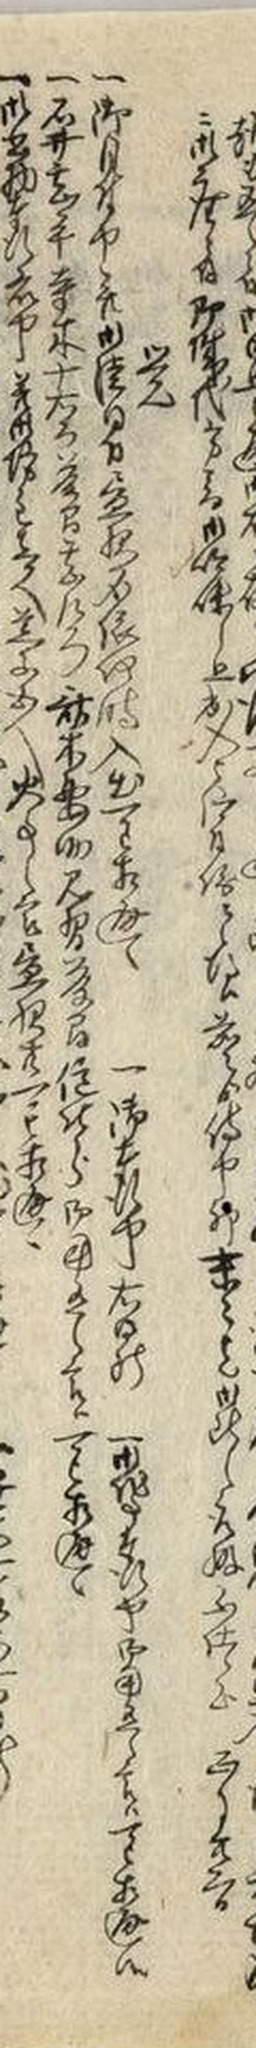一御目付中并御徒目付昼夜不依何時入出可被相通候一御奉行中右同断一御作事奉行中御用有之節は可被相通候
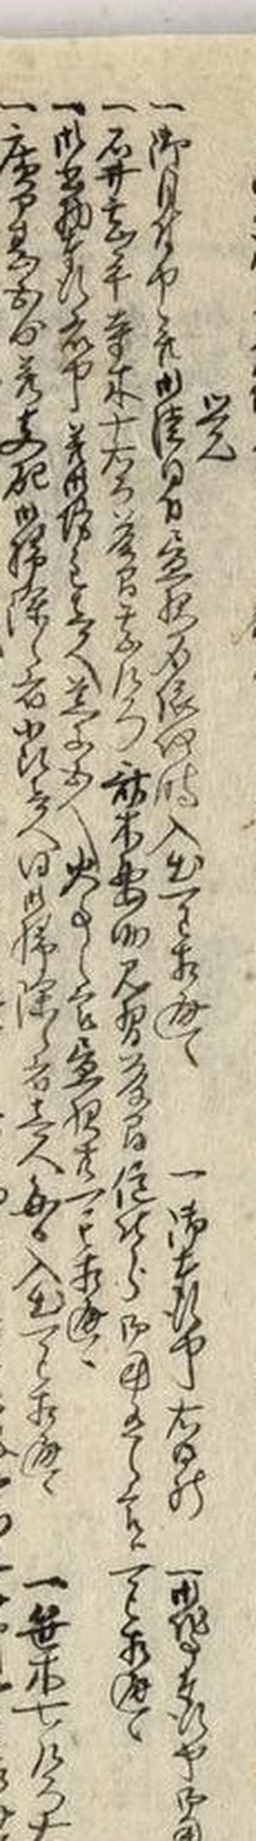一石井甚平寺木十右衛門藤間甚左衛門斎木要助見習藤間佳次郎御用有之候節可被相通候
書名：御門御櫓之部
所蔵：福井県文書館 Fukui Prefectural Archives
